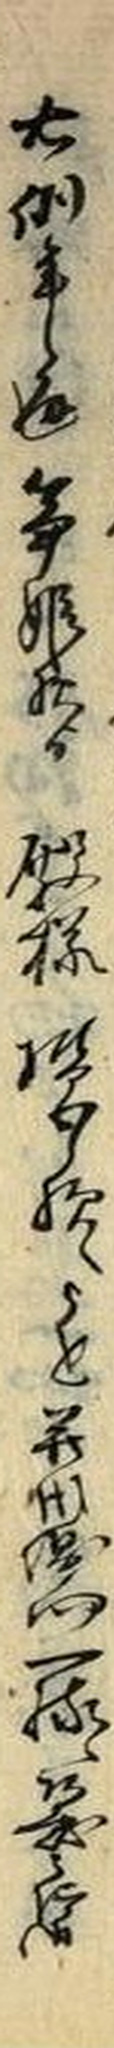右例年之通箏姫様ゟ殿様揩五郎様へ被進并御側向一統へ頂戴被仰付候
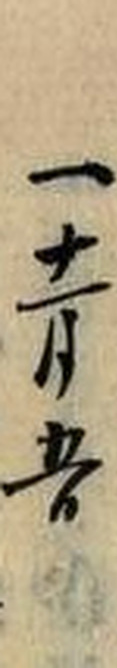一十一月五日
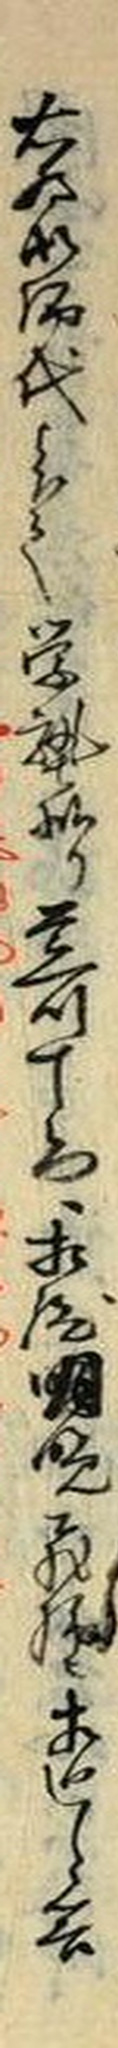右為御酒代被下之学塾掛り荒川十右衛門へ相渡明晩飛脚被相廻候筈
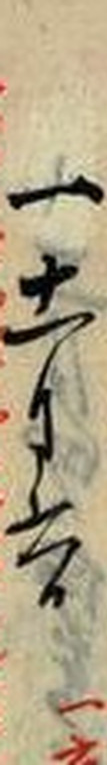一十一月六日
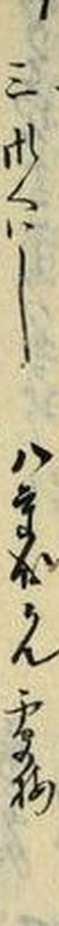三御くハし八重成かん雪の梅
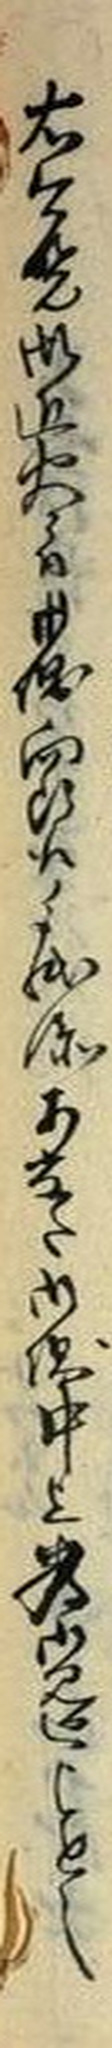右今晩御近火ニ付御側向頭取手紙添あなた御側中迄為御見廻被進之
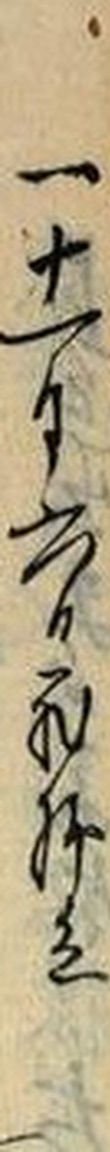一十一月六日飛脚立
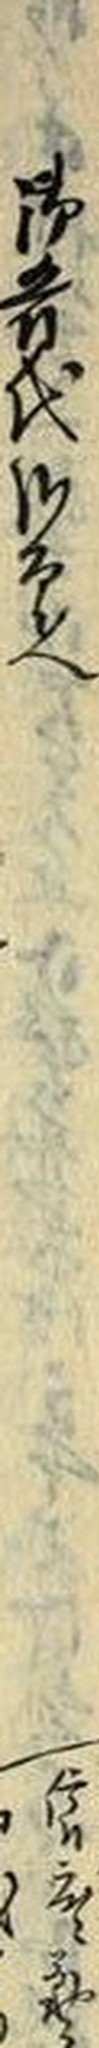御肴代弐百疋
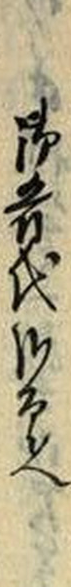御肴代弐百疋
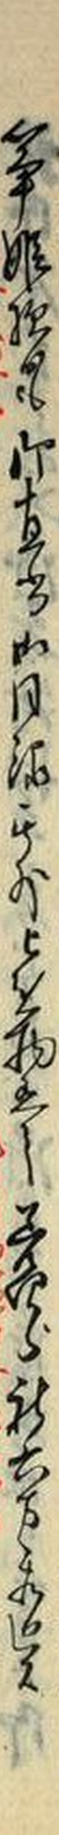箏姫様ゟも御直書御目録其外被進物有之善四郎新六方へ相廻ス
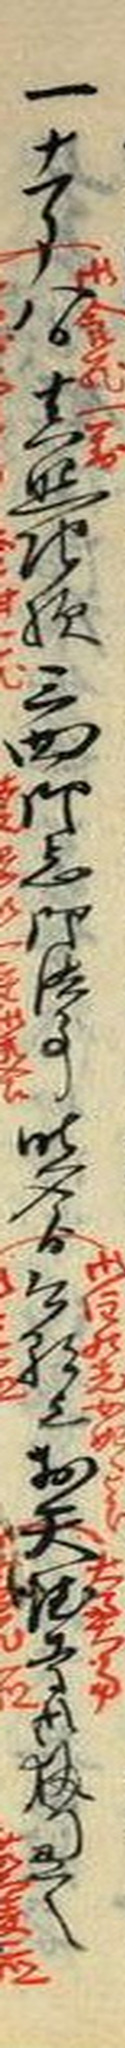一十一月八日真照院様三回御忌御法事昨夕ゟ今朝迄於天徳寺御執行有之
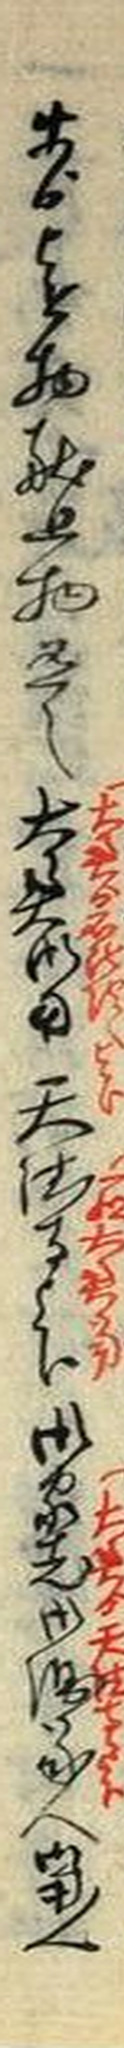方ゟ被進物献上物有之大奥御用天徳寺被下御家老御側御用人御用人
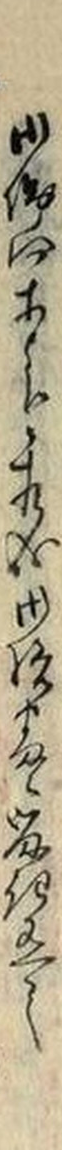御側向等被下ニ相成御膳番之留記有之
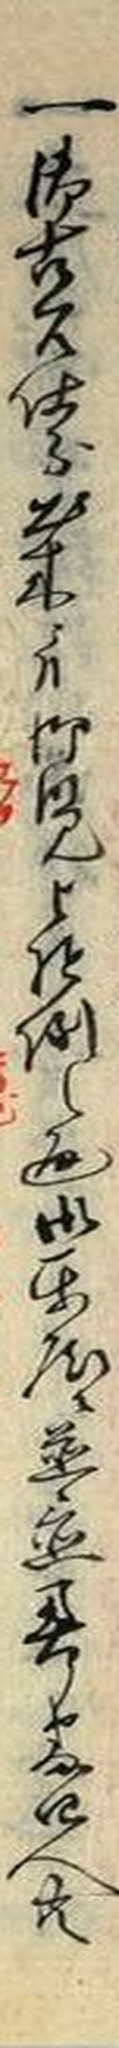一御古召仕分出来ニ付御覧被遊例之通御楽屋ニ並置奥之番四人共
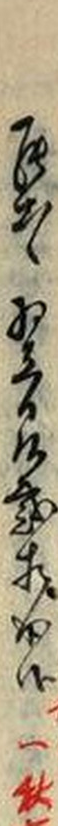罷出候翌日頂戴相成候
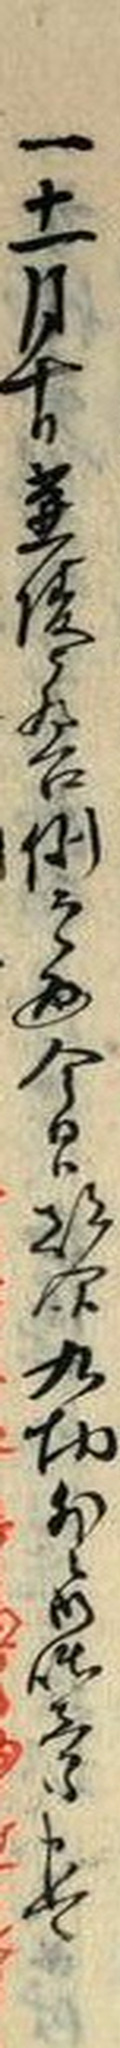一十一月十日燕陵被為召例之通今日ハ都合九切外ニ御咄壱ツ申上候
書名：少傅日録抄（斉承付側向頭取日記、在府）
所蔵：福井県文書館 Fukui Prefectural Archives
